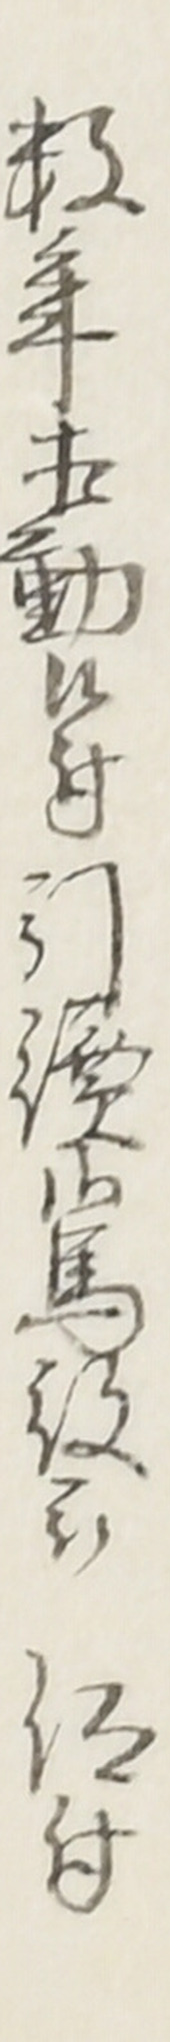数年相勤候付引続御馬役被仰付
